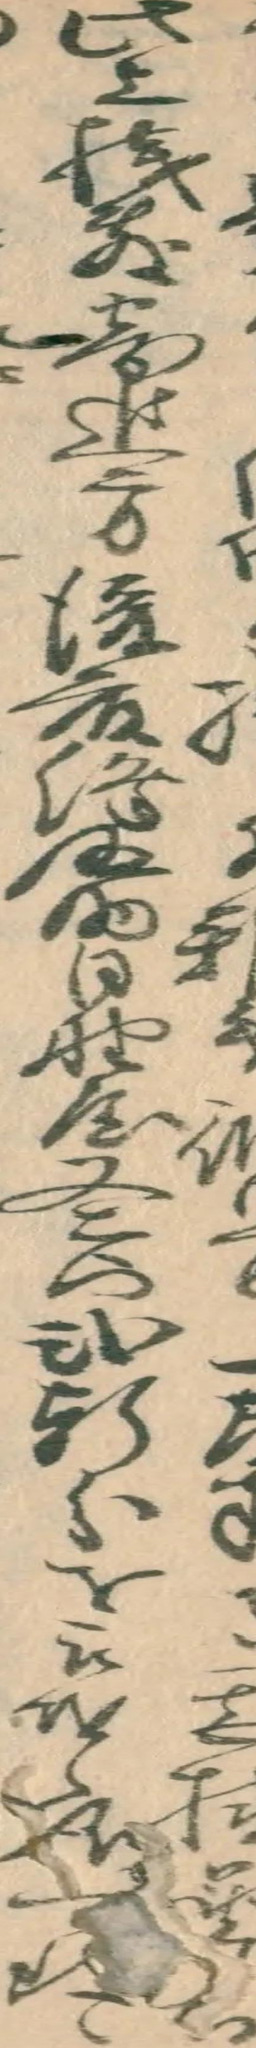此上桟敷寄進方後藤縫殿日野屋又右衛門弐軒分を被遣候様ニ可致候
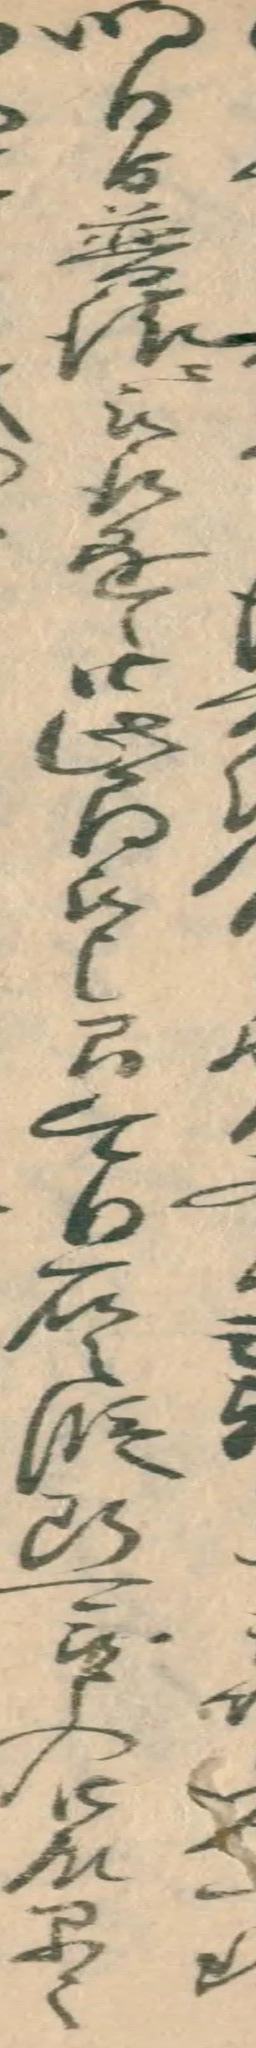明日ゟ普請ニ被取懸候由此間被申候間今日右之段断可被申入由故早々
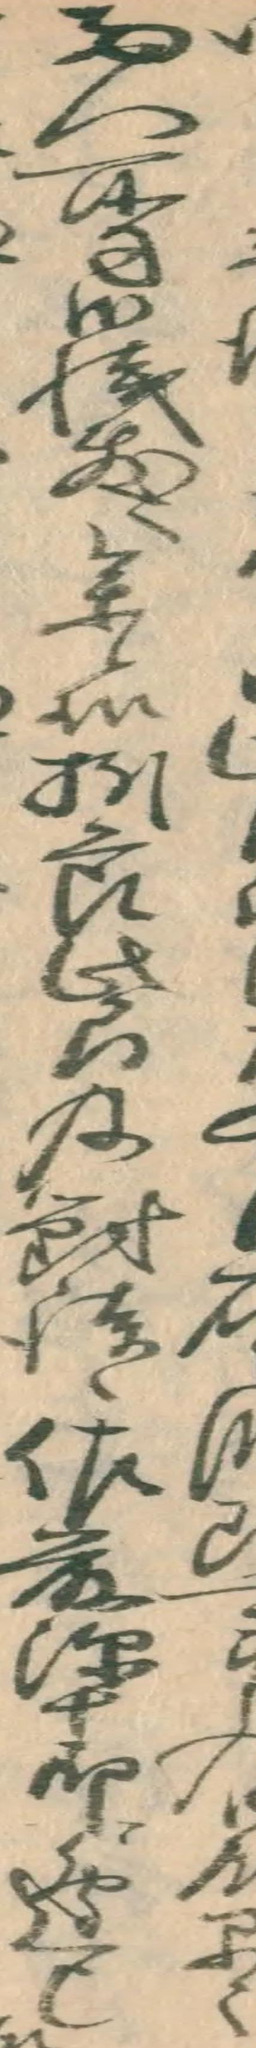両人所用御桟敷へ参候処折節此間及対談候佐藤源十郎ニ逢申候故
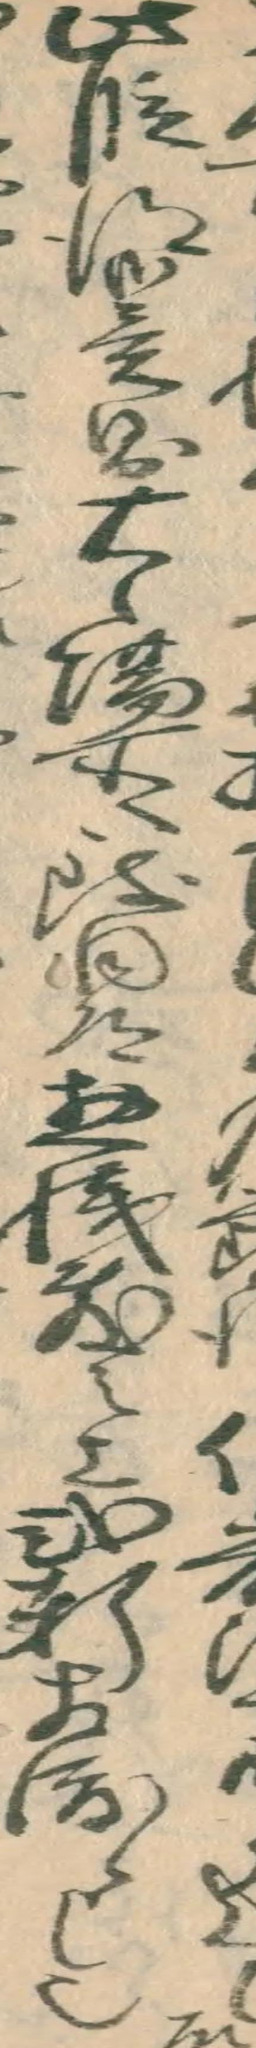此段得御意則右之場所へ致同道惣桟敷之上弐軒相渡申候也
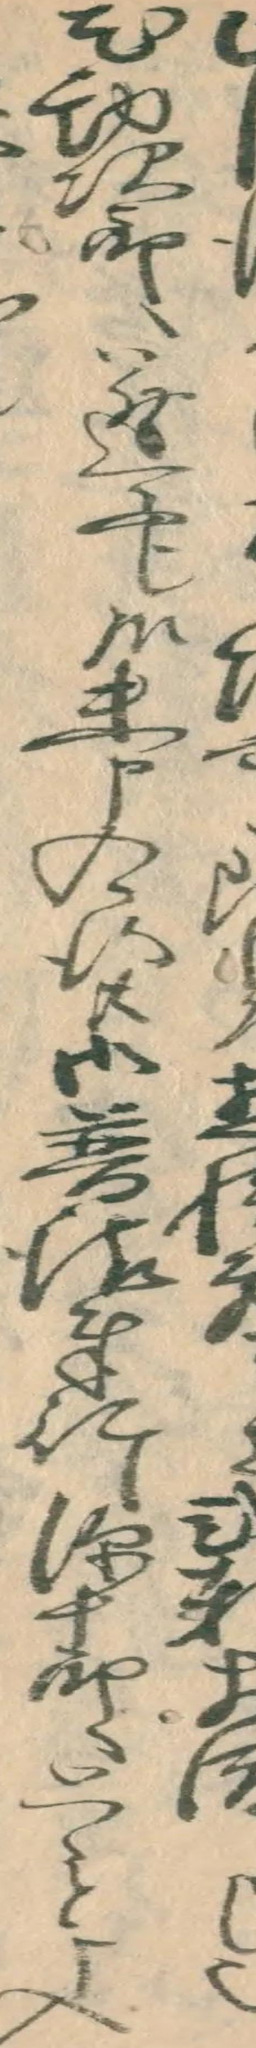尤勘次郎へハ逢不申候故未申入候得共御普請奉行源十郎へとくと申入
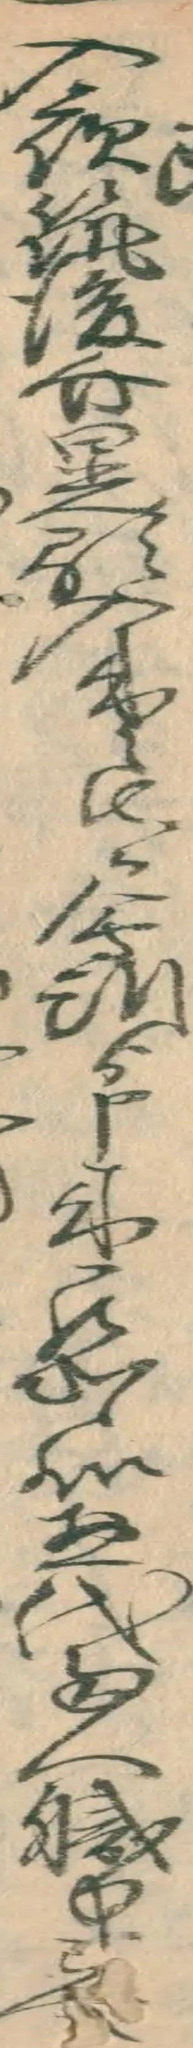一入夜筑後介晃顕入来候由ニ而会所ゟ申来罷出候処惣代両人職中
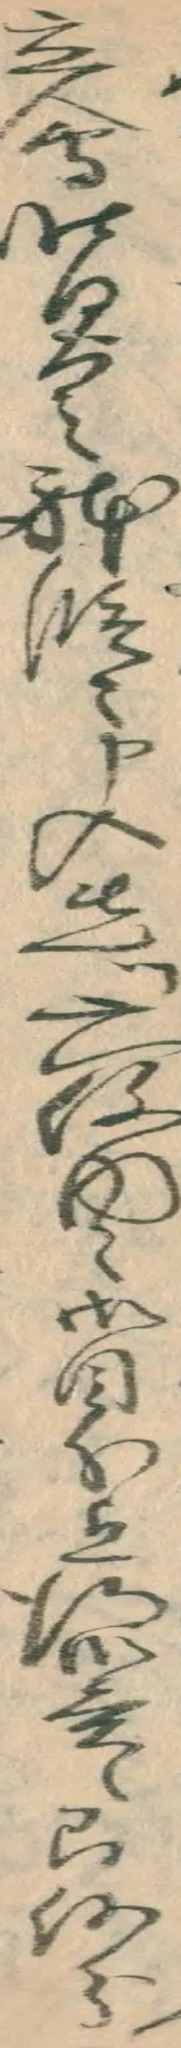立会昨日ゟ之体段々申入先ツ六役内々御自分迄得御意候間何分
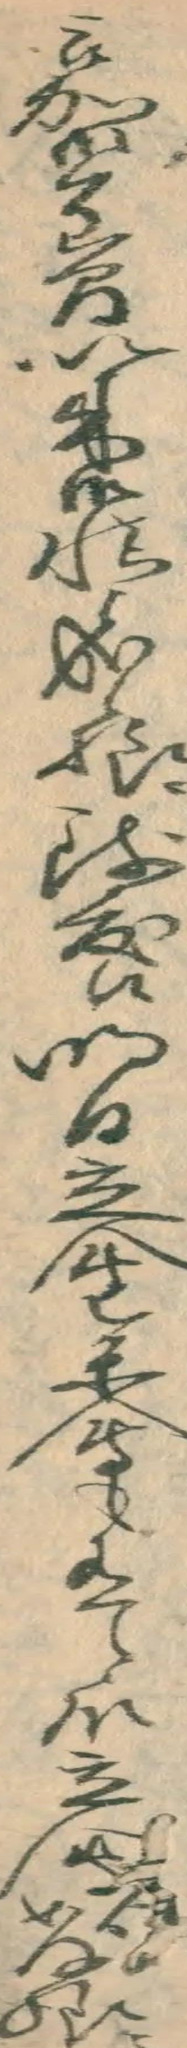被加御了簡以来御慎被成候様ニ致度候明日立会参会も有之候故立会ゟ如何様ニ

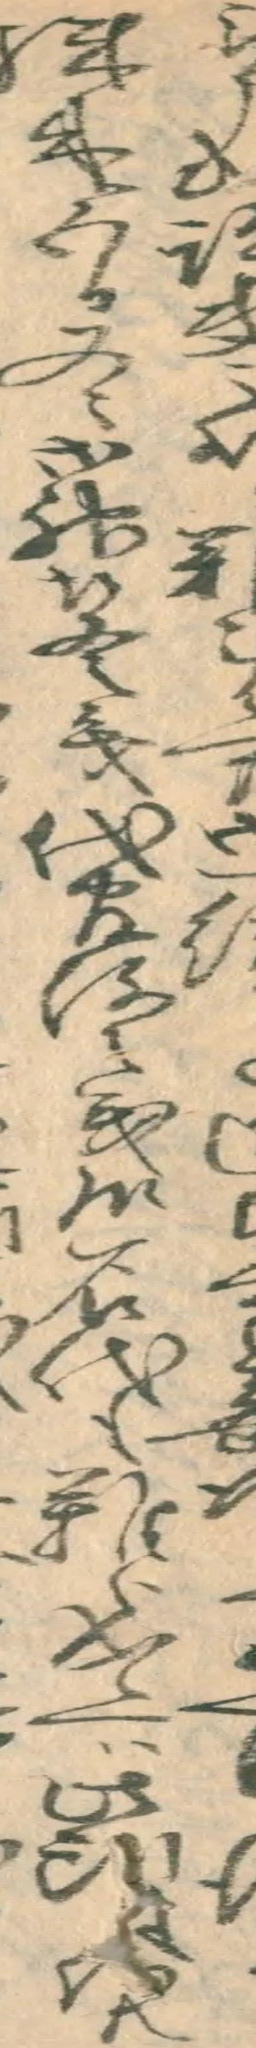殊来ル五日又々御神事之義代官役之義故名代も難被成候へハ此所も何共
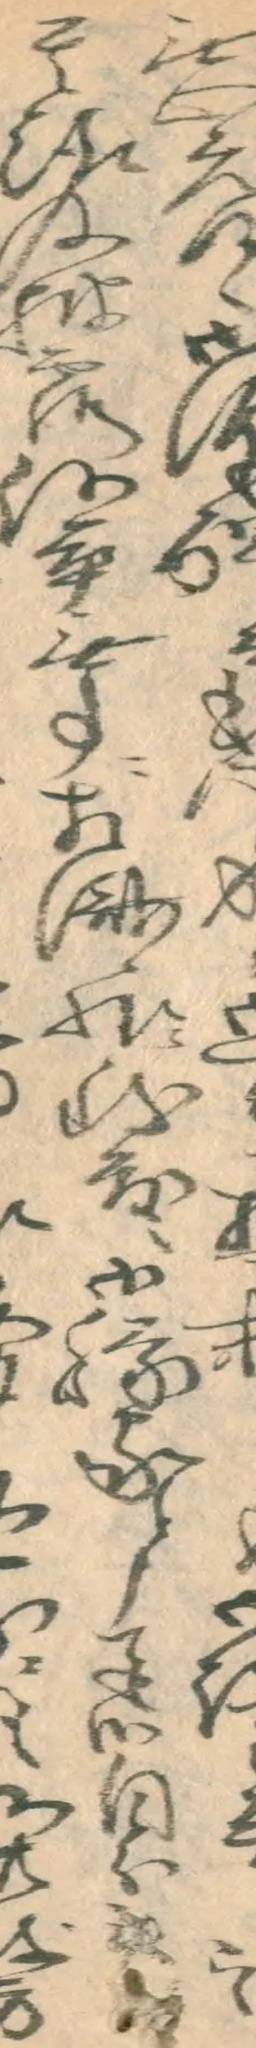其趣及披露何卒無事ニ相済候様ニ致度候御縁家と申ても御自分
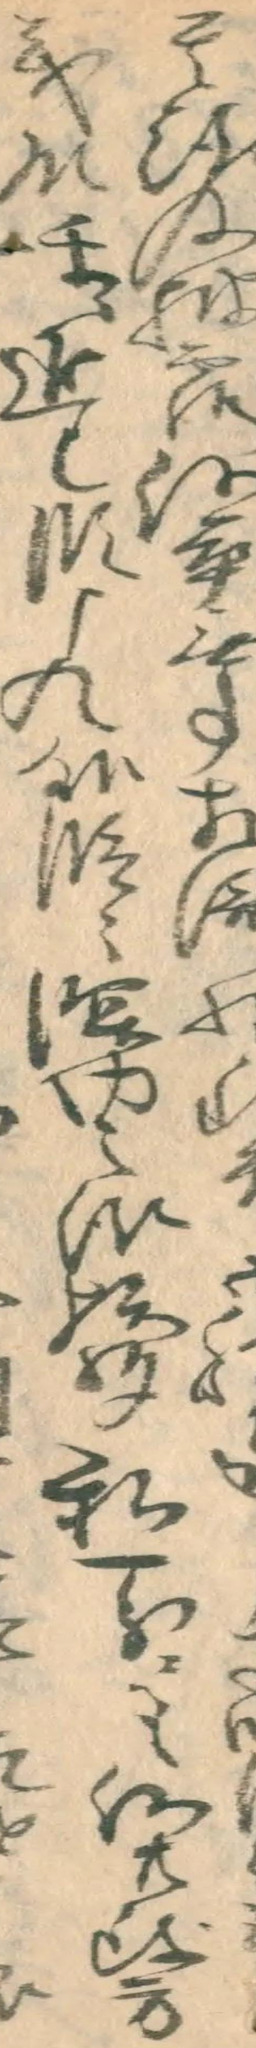義故呼ニ進申候段申入候処段々深切之趣挨拶私一分ニ候も何共致方
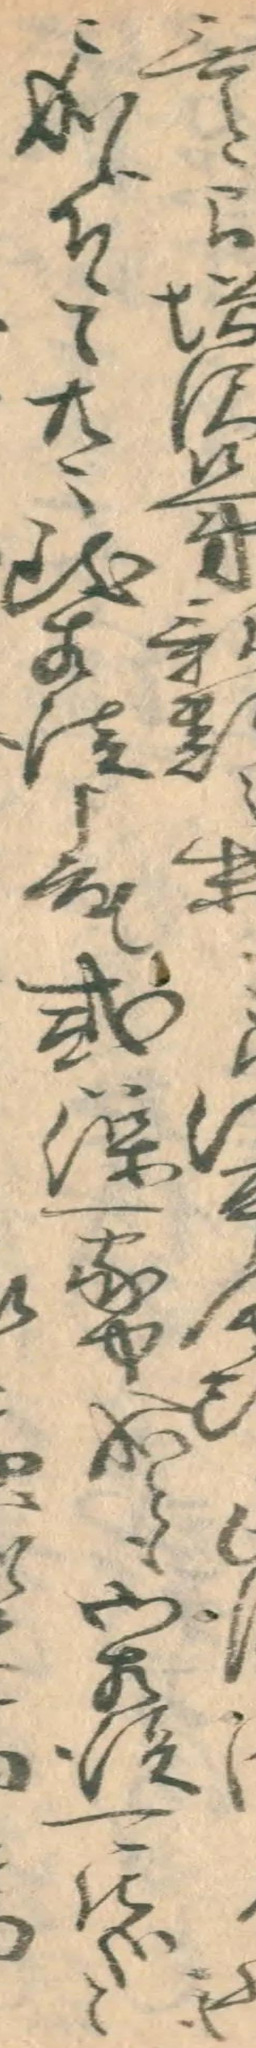被成被下候はゝ共々致相談申度候或ハ保一家中へ成とも御相談可仕哉と
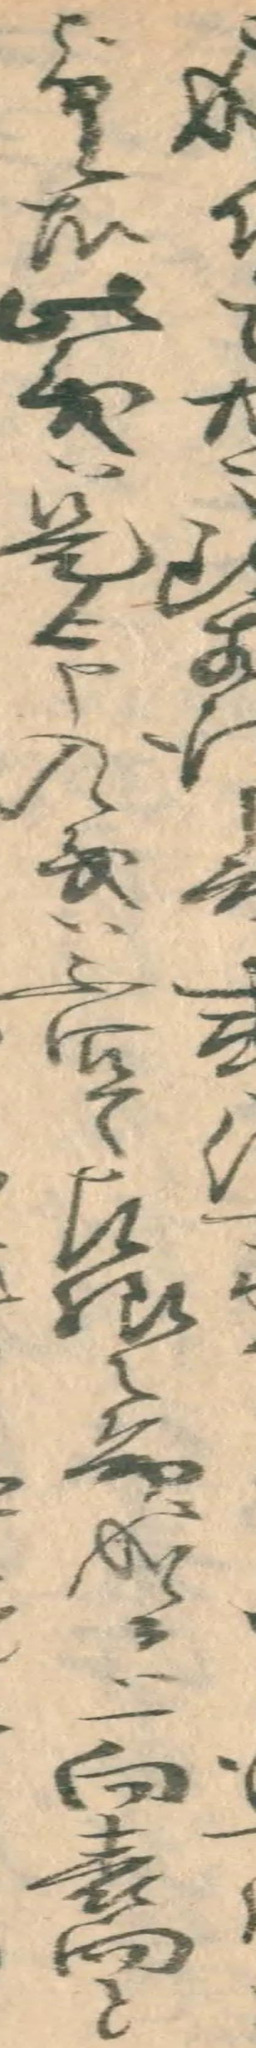被申候故此義ハ是ゟ申入候義ハ不宜候左様之筋ニ成候而ハ一向表向と
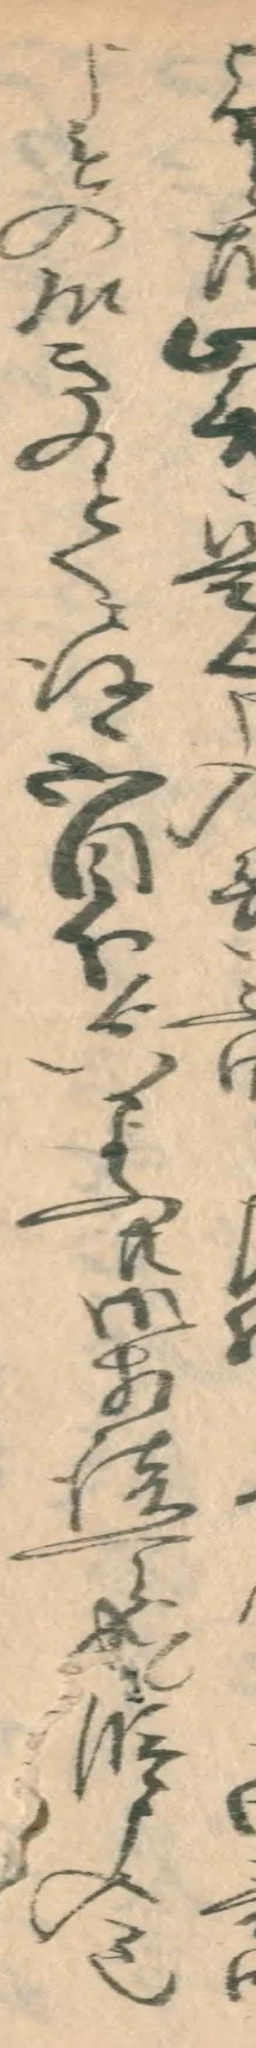申もの故きのとくニ存候御自分ゟいかよふ共御相談可被成候段申入候也
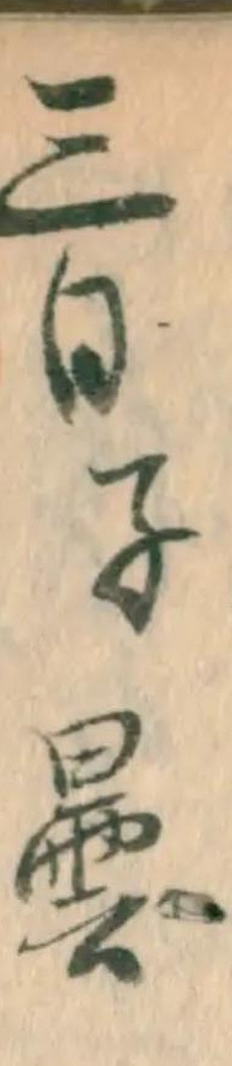三日子曇
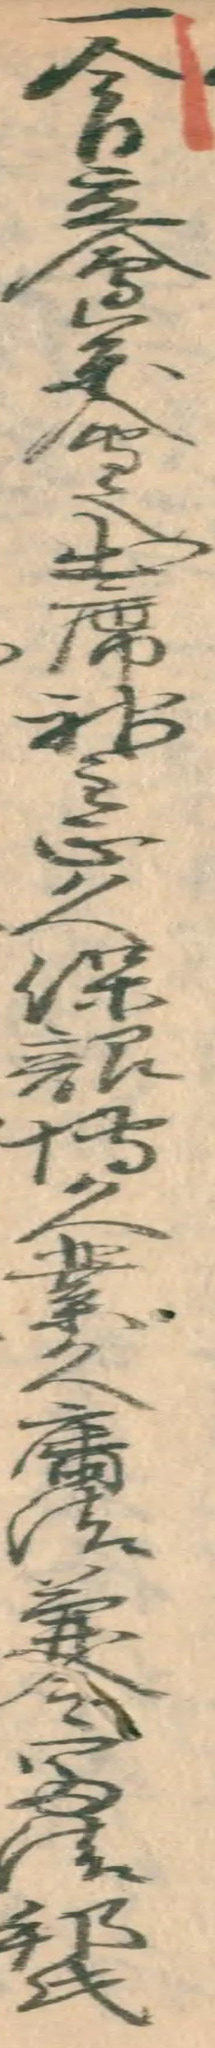一今日立会参会也出席神主正久保韶博久業久庸清兼令富清邦氏
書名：賀茂社記録. 第58冊
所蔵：国立国会図書館 National Diet Library, JAPAN
